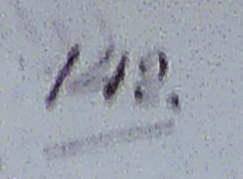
142.
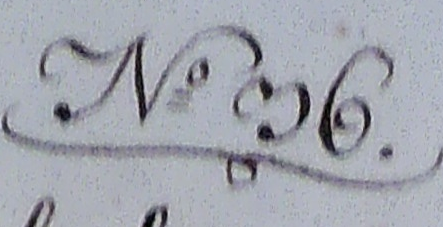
No͇ 36.
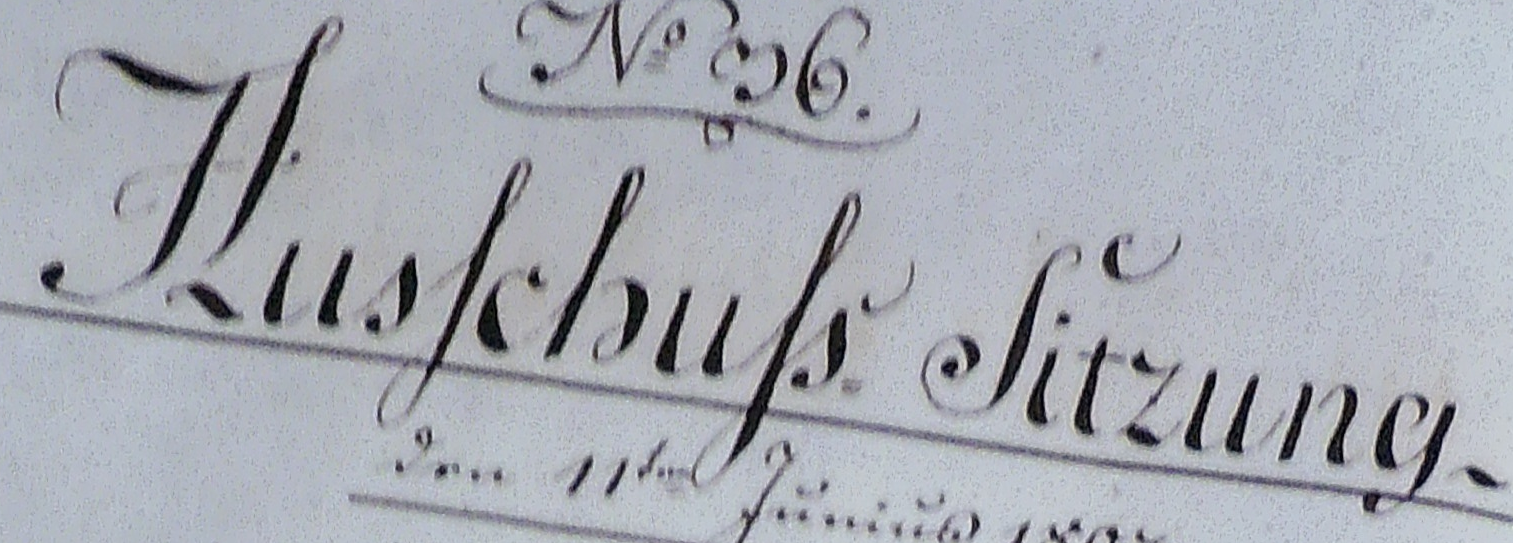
Ausschus‗Sitzung
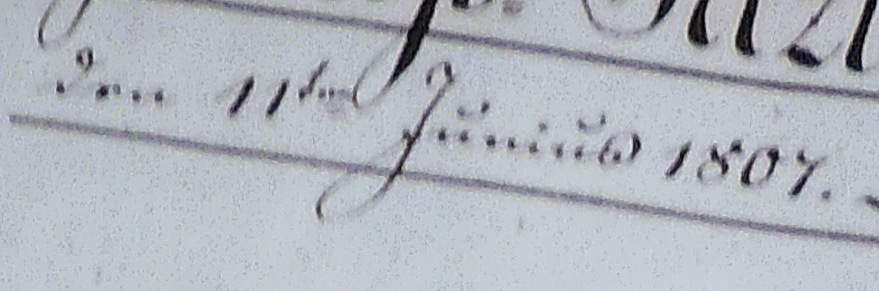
den 11te͇n Junius 1807.
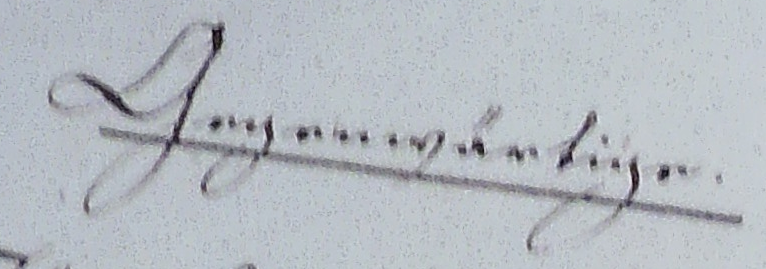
Gegenwärtige.
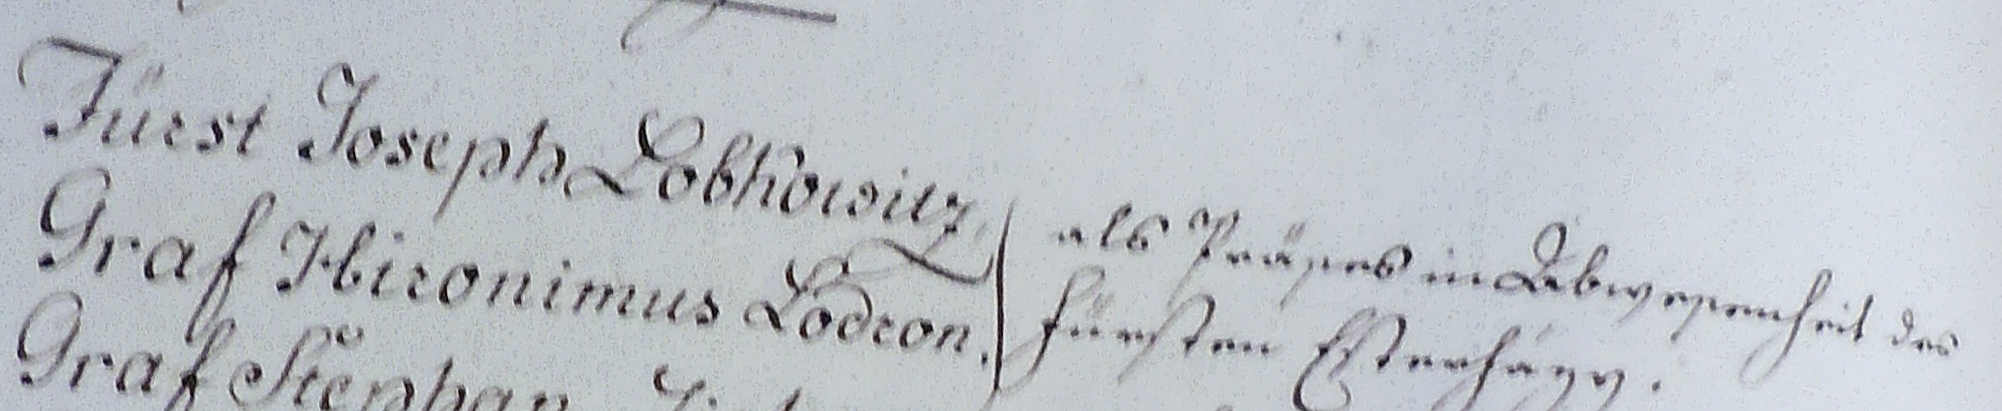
Fürst Joseph Lobkowitz als Präses in Abwesenheit des
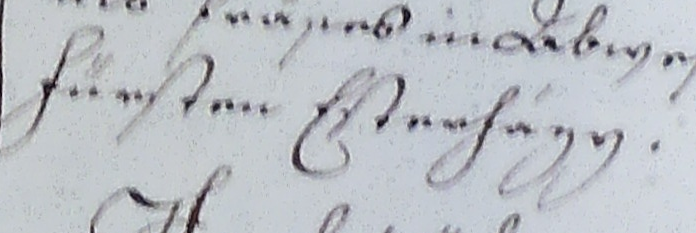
Fürsten Esterhàzy.
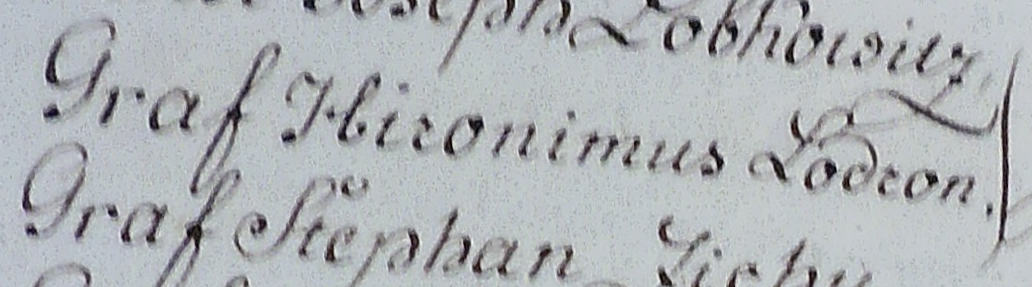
Graf Hironimus Lodron
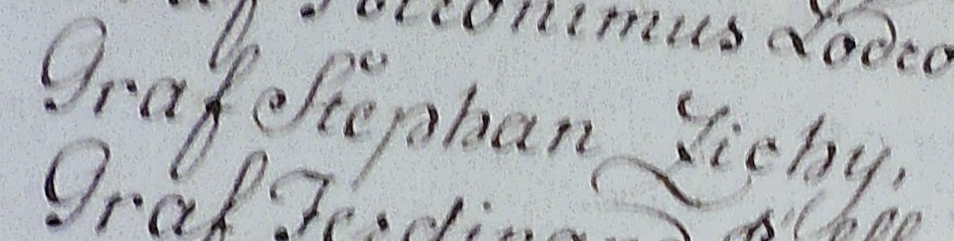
Graf Stephan Zichy.
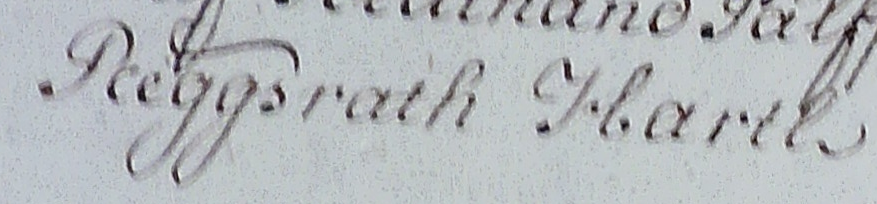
Reg͞gsrath Hartl.
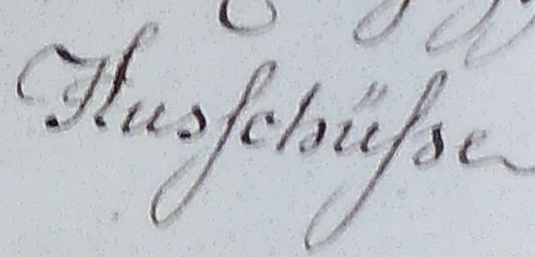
Ausschüsse
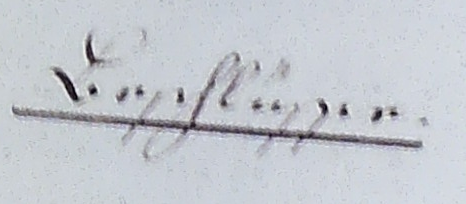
Beschlüsse.
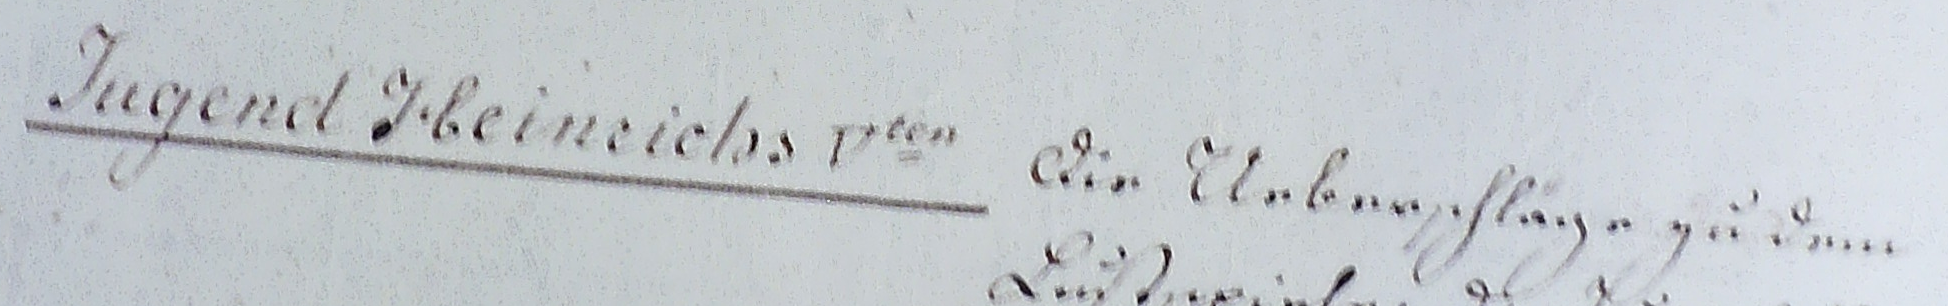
Jugend Heinrichs 1ste͇n Die Ueberschläge zu dem
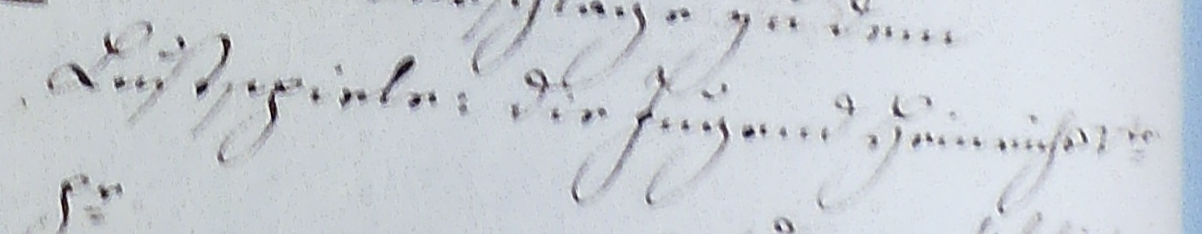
Lustspiele die Jugend Heinrichs 1te͇
